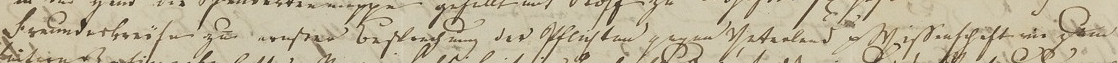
Freundeskreise zur ernsten Besprechung der Pflichten gegen Vaterland & Wissenschaft wie zum
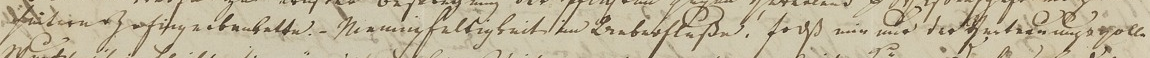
heitern Zofingerbankette. Mannigfaltigkeit im Ueberfluße! so dß mir nur der Vertrauens volle
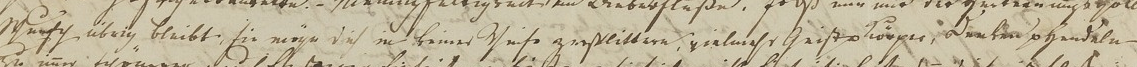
Wunsch übrig bleibt, sie möge dich in keiner Weise zersplittern, vielmehr Geist & Körper, Denken & Handeln
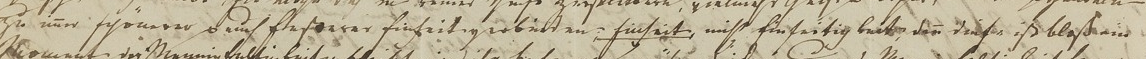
zu immer schönerer & auch festerer Einheit verbinden; Einheit, nicht Einseitigkeit, denn diese ist bloß ein
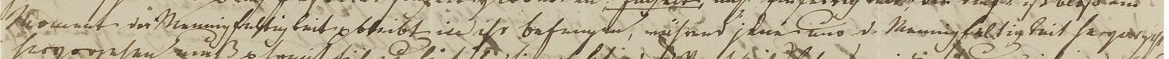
Moment der Mannigfaltigkeit & bleibt in ihr befangen, während jene aus d. Mannigfaltigkeit hervorgeht,
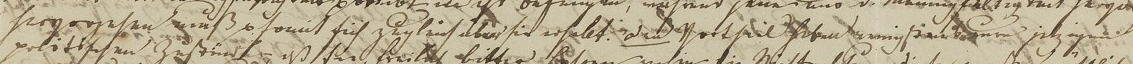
hervorgehen muß & somit sich zugleich über sie erhebt. Den Vortheil haben wenigstens eure jetzigen
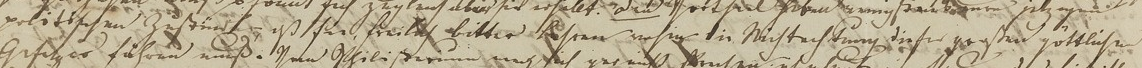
politischen Zustände, dß sie, freilich bitter lehren wohin die Nichtachtung dieses großen göttlichen
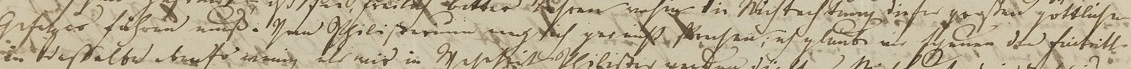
Gesetzes führen muß. Vom Philisterium mag ich gar nicht sprechen; ich glaube wir scheuen den Eintritt
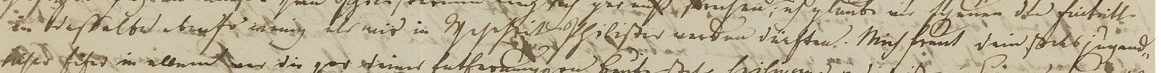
in dasselbe eben so wenig als wir in Wahrheit Philister werden dürften. Mich freut dein stets jugend-
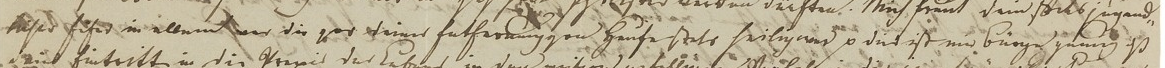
licher Eifer in allem was dir vor deiner Entfernung von Hause stets heilig war & dies ist mir Bürge genug dß
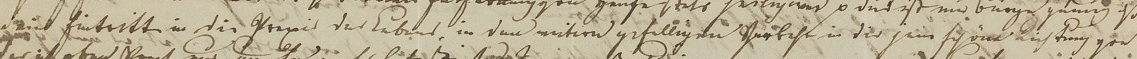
dein Eintritt in die Praxis des Lebens, in den weitern geselligen Verkehr in dir jene schöne Richtung von
